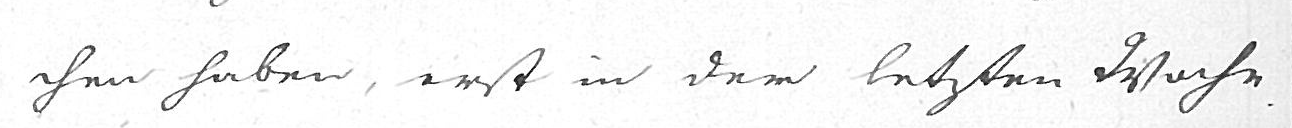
chen haben, erst in der letzten Woche
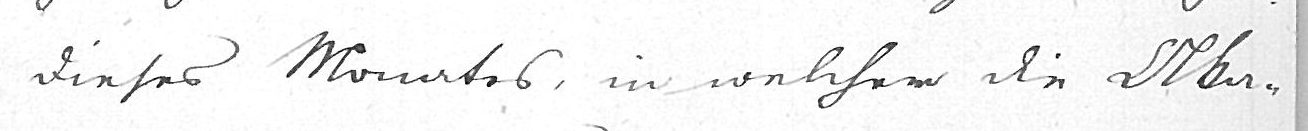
dieses Monates, in welcher die Aka-
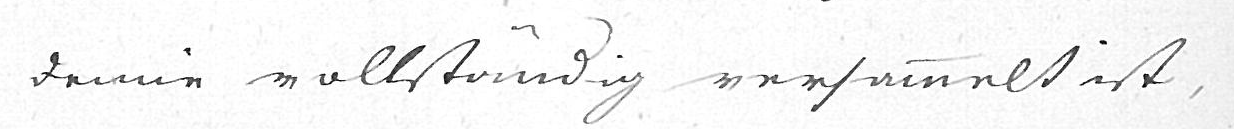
demie vollständig versammelt ist,
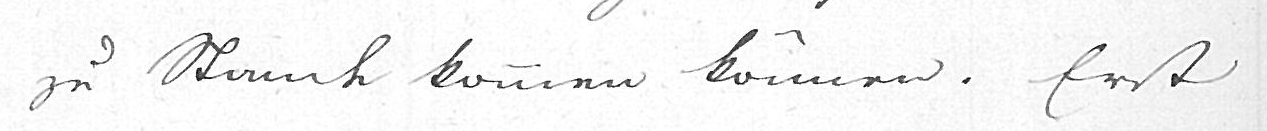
zu Stande kommen können. Erst
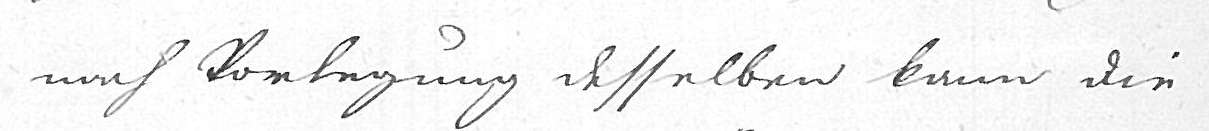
nach Vorlegung desselben kann die
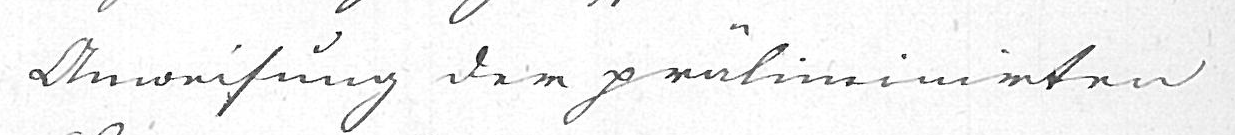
Anweisung der präliminirten
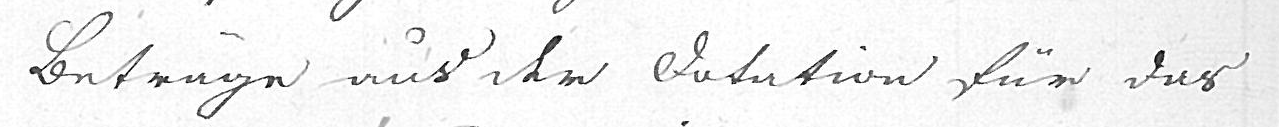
Beträge aus der Dotation für das
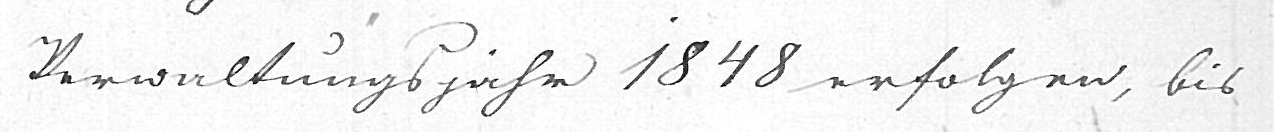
Verwaltungsjahr 1848 erfolgen, bis
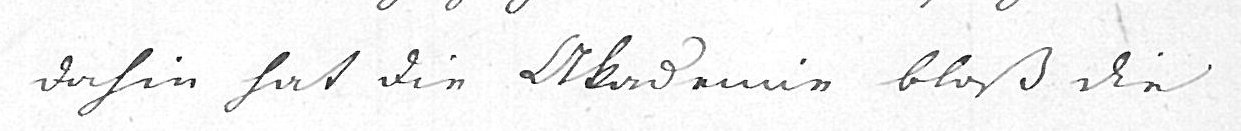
dahin hat die Akademie bloß die
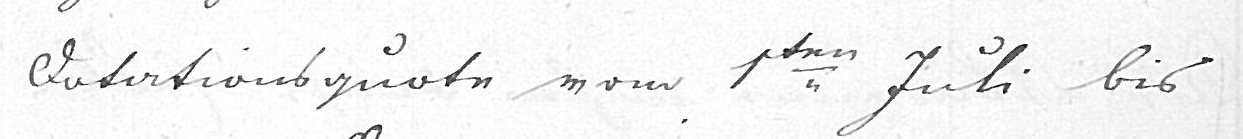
Dotationsquote vom 1ten Juli bis
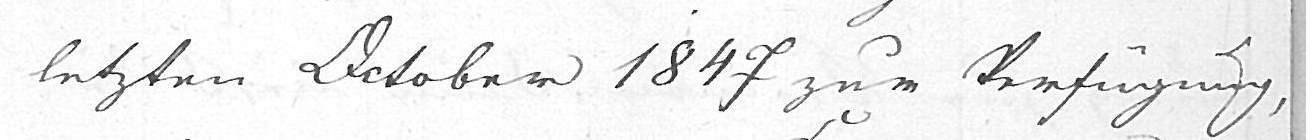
letzten October 1847 zur Verfügung,
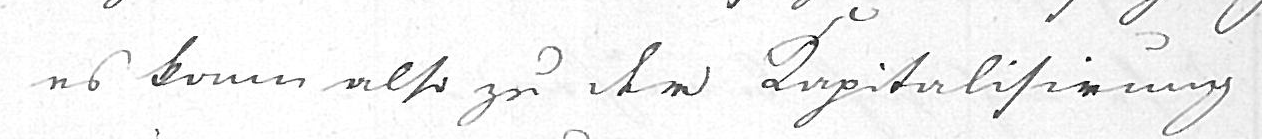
es kann also zu der Kapitalisirung
